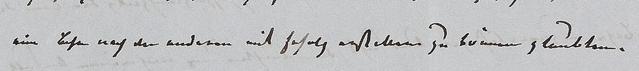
eine Bahn nach der anderen mit Erfolg erstellen zu können glaubten.
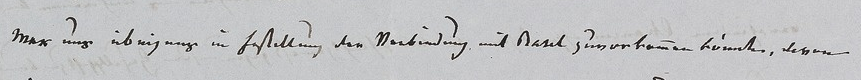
Wer uns übrigens in Erstellung der Verbindung mit Basel zuvorkommen könnte, davon
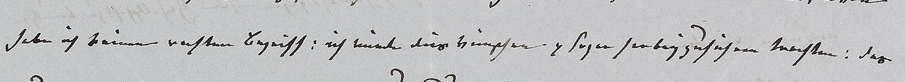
habe ich keinen rechten Begriff: ich würde dies wünschen & sogar herbeyzuführen trachten: das
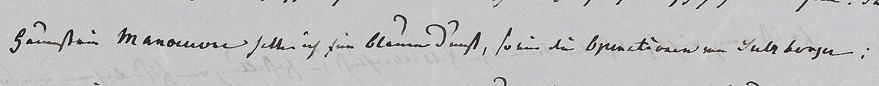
Hauenstein Manoeuvre halte ich für blauen Dunst, so wie die Operationen von Sulzberger :
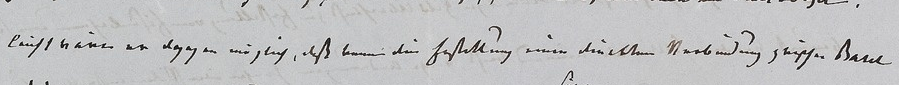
leicht wäre es dagegen möglich, daß wenn die Erstellung einer direkten Verbindung zwischen Basel
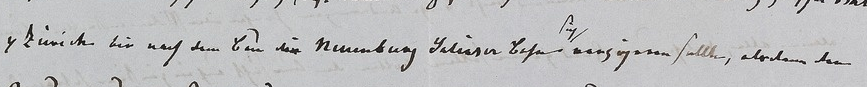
& Zürich bis nach dem Bau der NeuenburgSalinser Bahn sich verzögern sollte, alsdann der
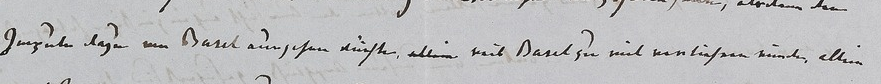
Impuls dazu von Basel ausgehen dürfte, allein weil Basel zu viel verliehren würde, allein
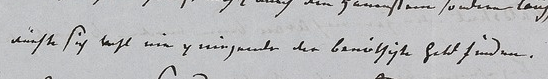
dürfte sich wohl nie & nirgends das benöthigte Geld finden.
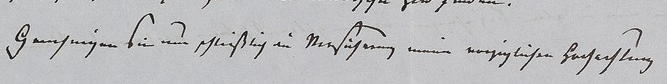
Genehmigen Sie nun schließlich die Versicherung meiner vorzüglichen Hochachtung
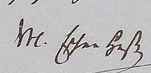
M. Escher Heß
